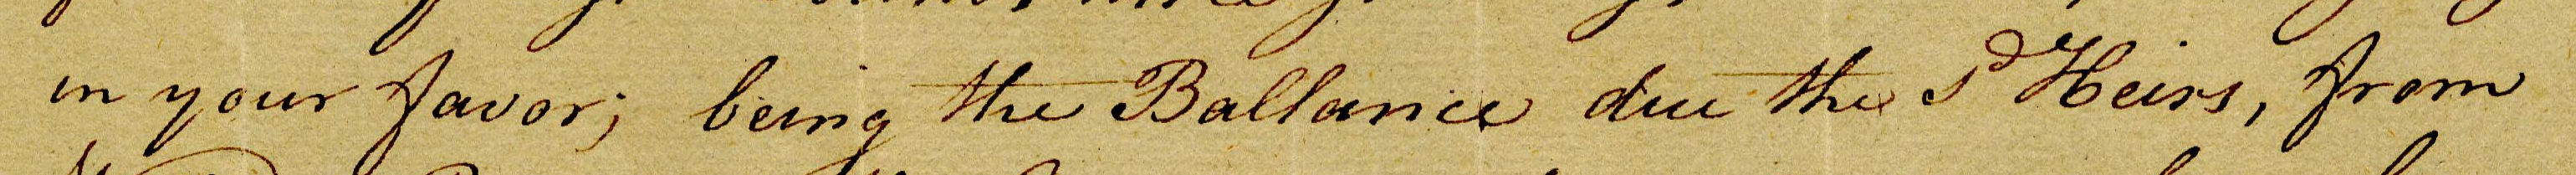in your favor; being the Ballance due the s^d Heirs, from
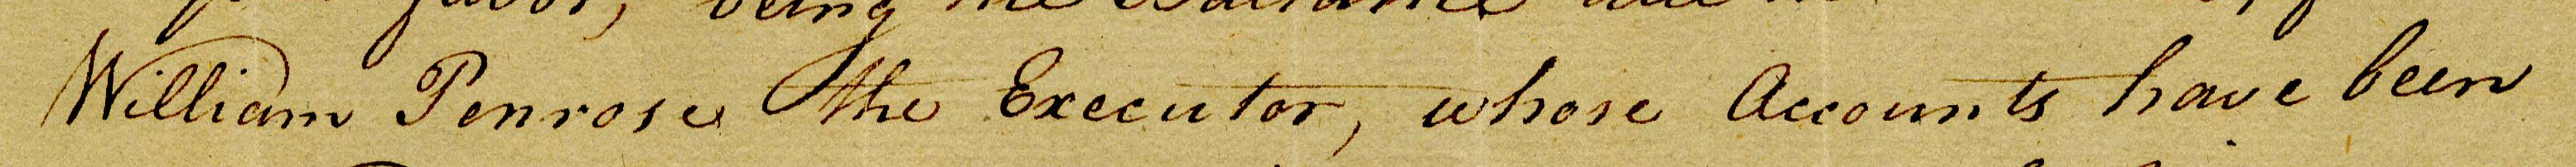William Penrose the Executor, whose Accounts have been
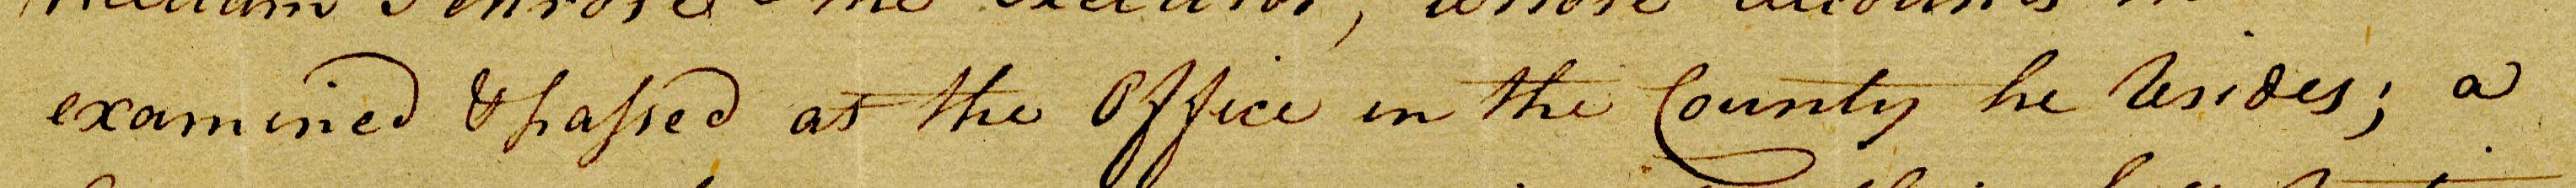examined & passed at the office in the County he resides; a
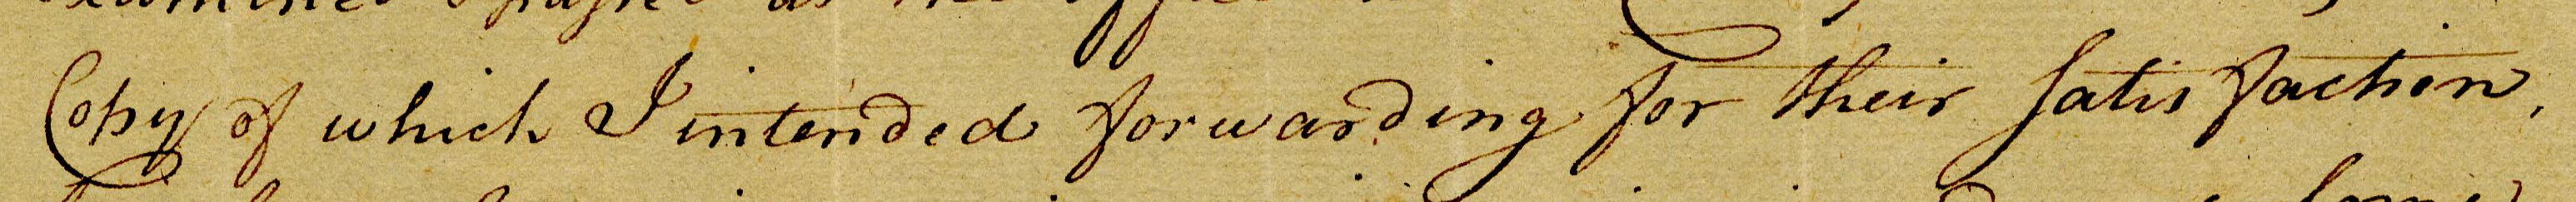Copy of which I intended forwarding for their satisfaction,
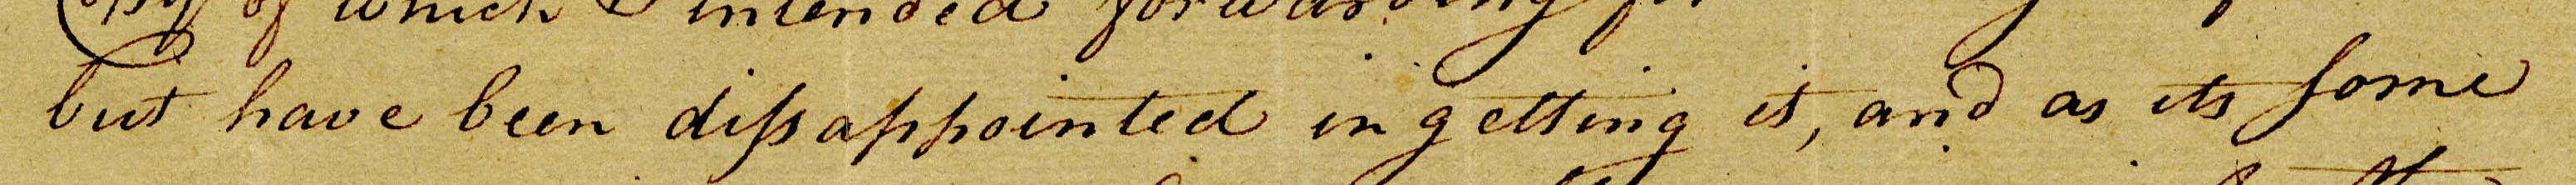but have been disappointed in getting it, and as its some
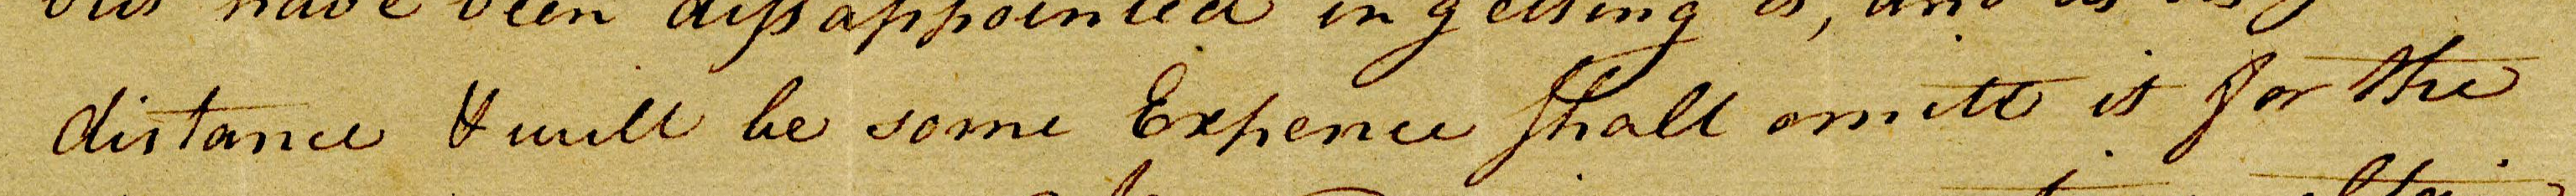distance & will be some Expence shall omitt it for the
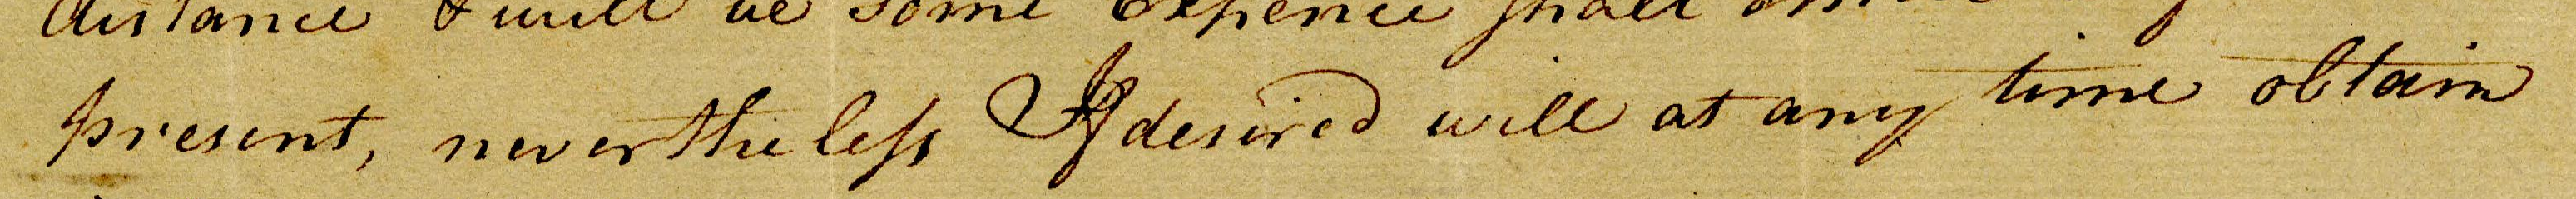present, nevertheless If desired will at any time obtain
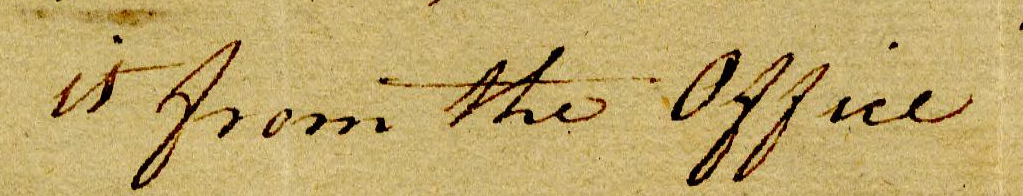it from the office
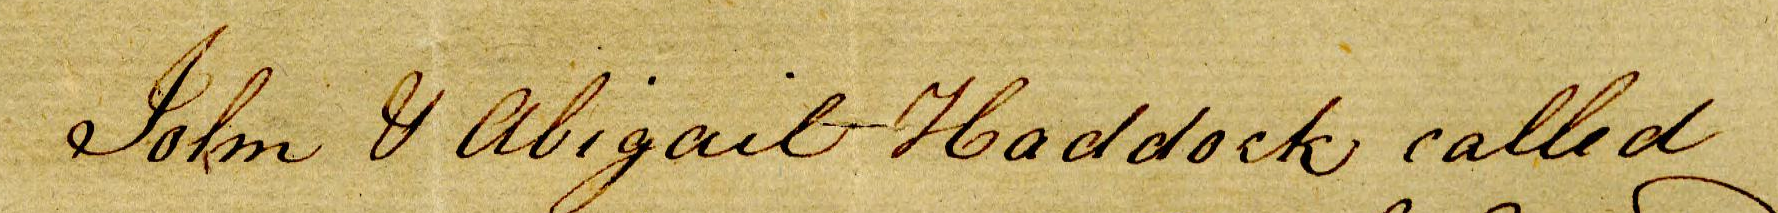John & Abigail Haddock called
